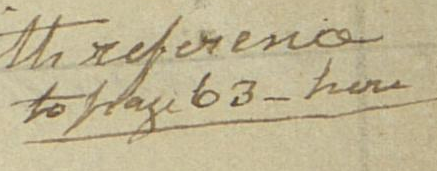to page 63 here
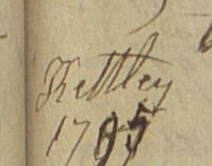Kettley
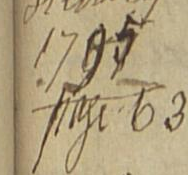1795
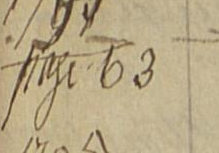page 63
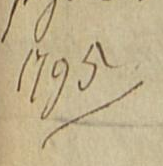1795
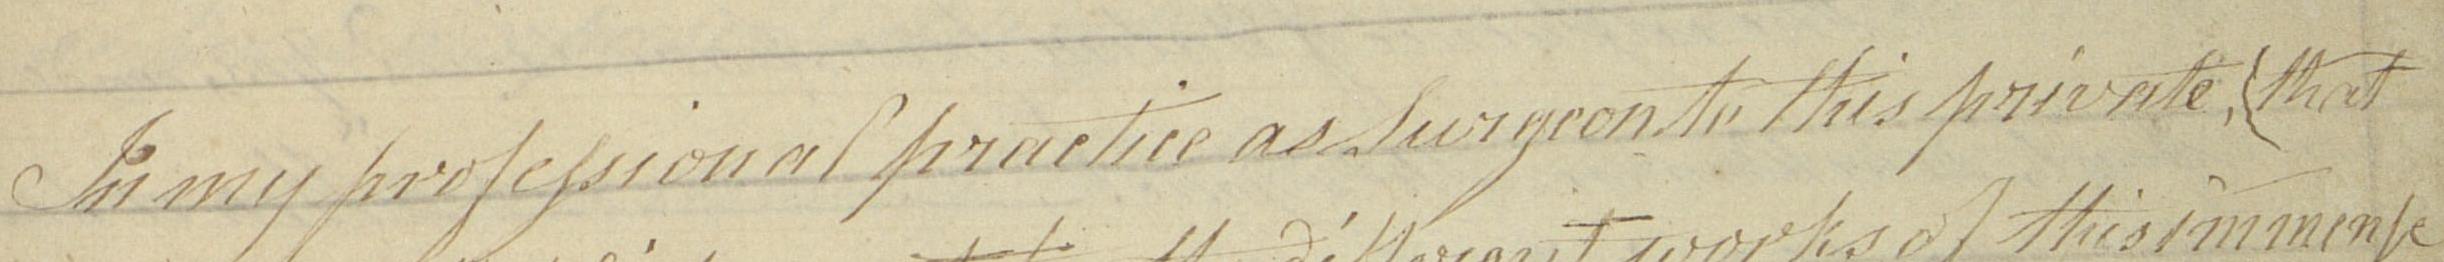In my professional practice as Surgeon to this private (that
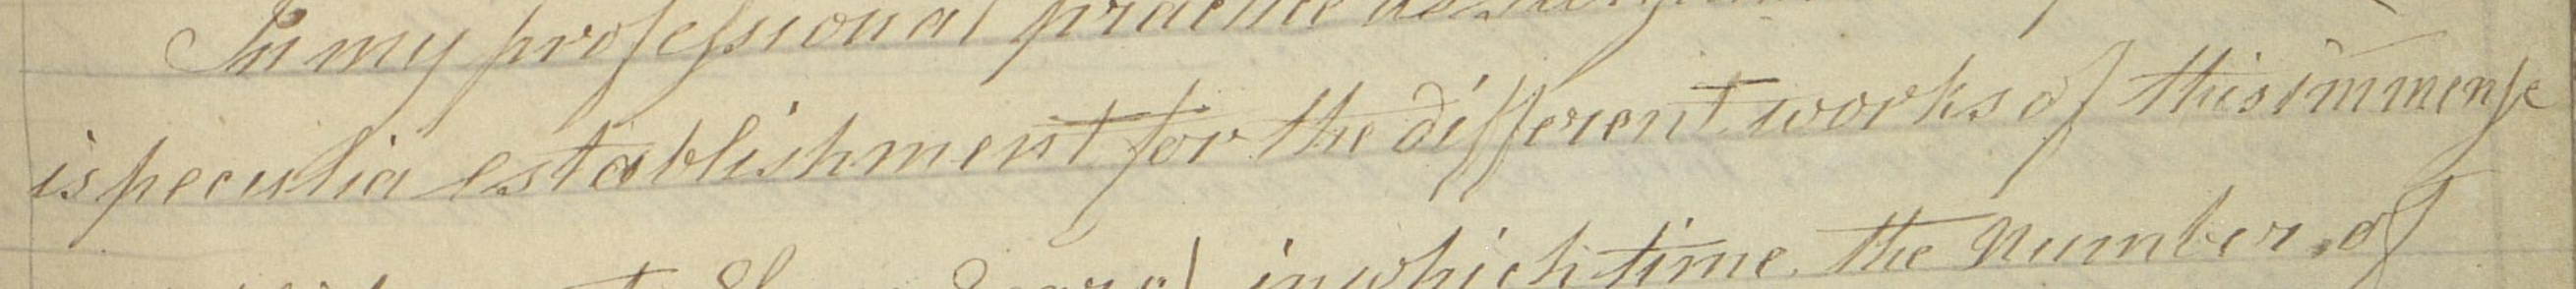is peculiar establishment for the different works of this immense
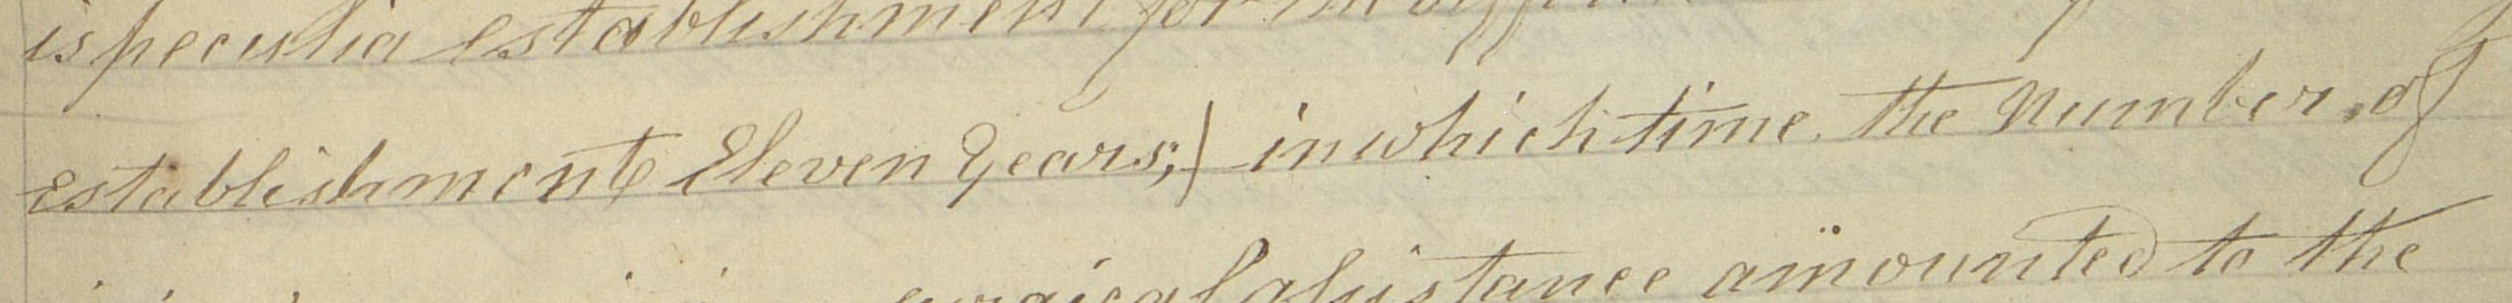Establishment Eleven years,) in which time the number of
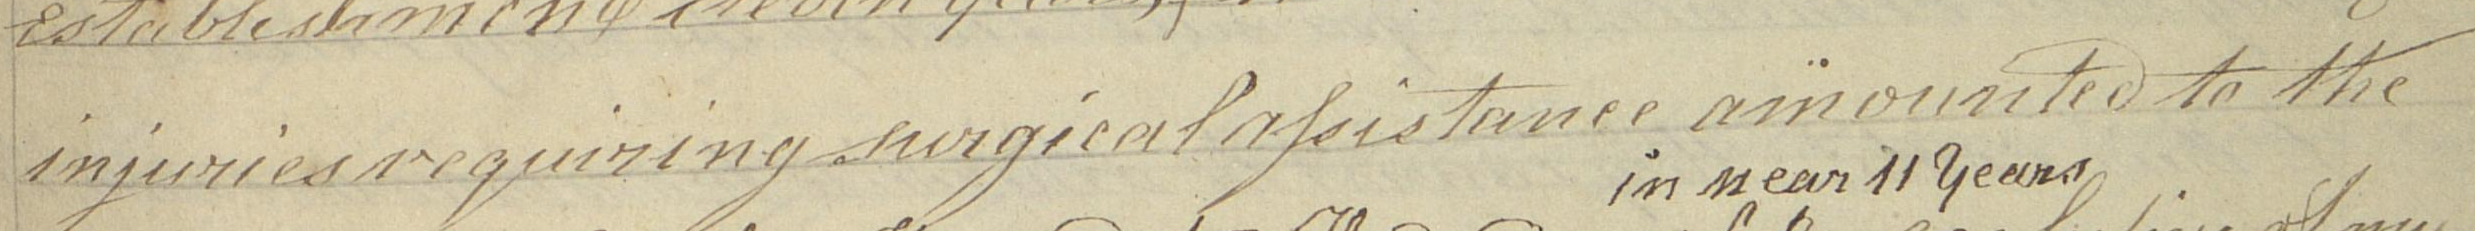injuries requiring surgical Assistance amounted to the
